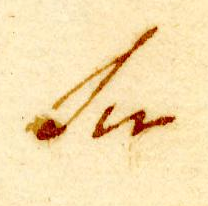Sir
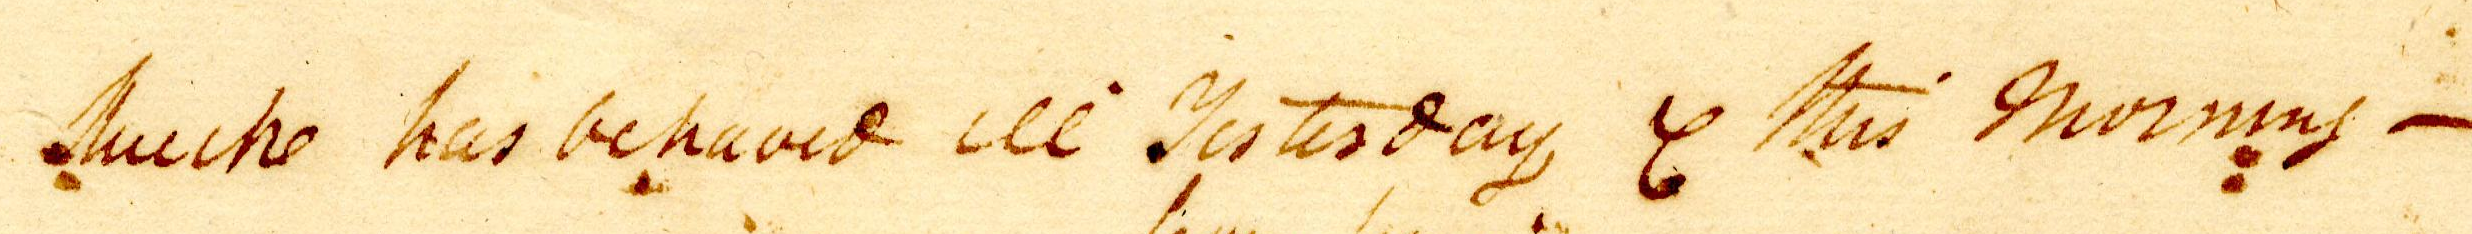Ruche has behaved ill Yesterday, & this morning.
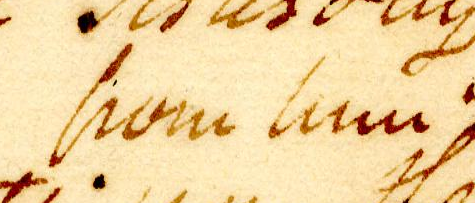from him
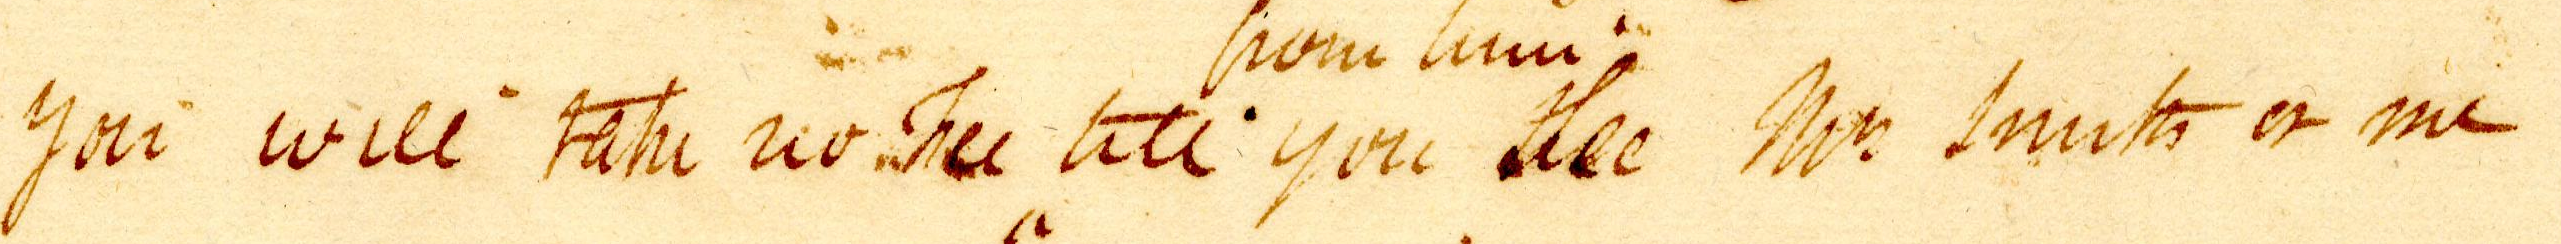You will take no Fee ^ till you see M^r Smith or me
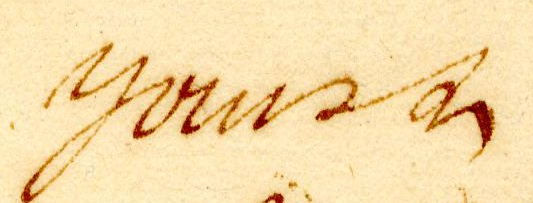Yours,
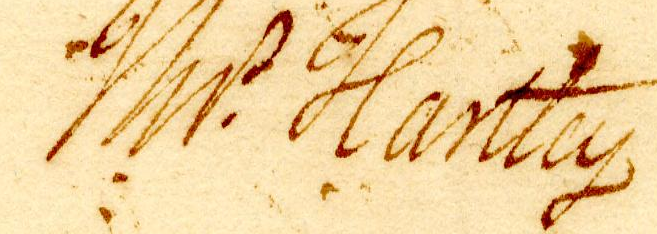M^r. Hartley
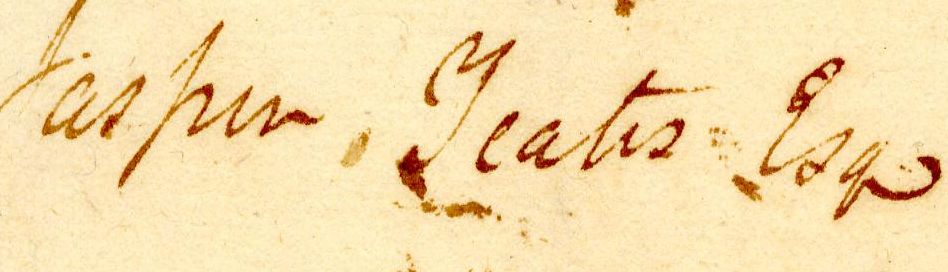Jasper Yeates Esq
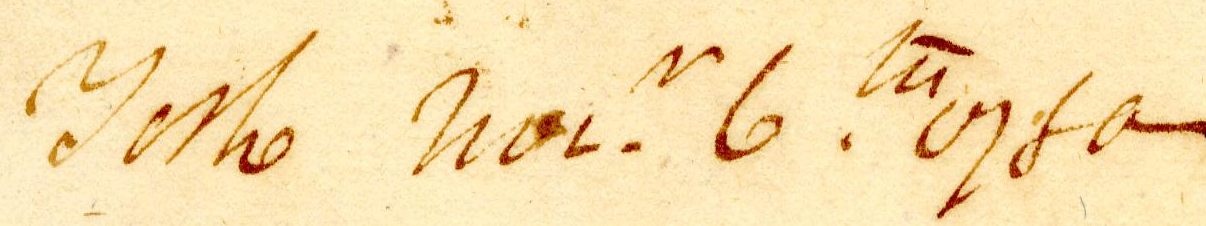York Nov^r. 6^th. 1780
